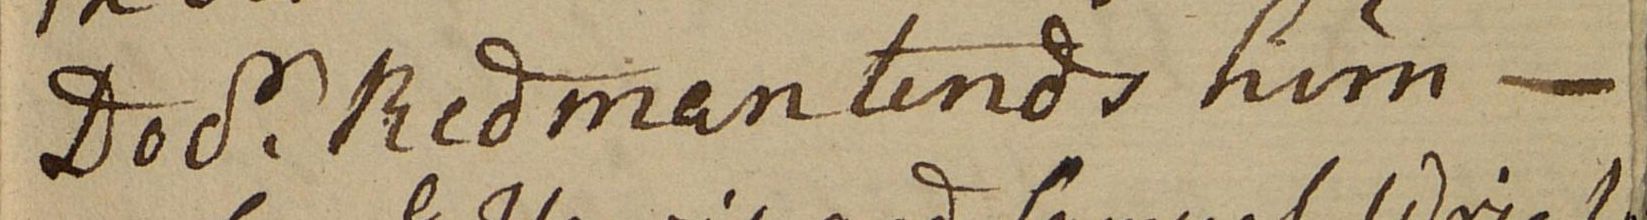Doc^r. Redman tends him-
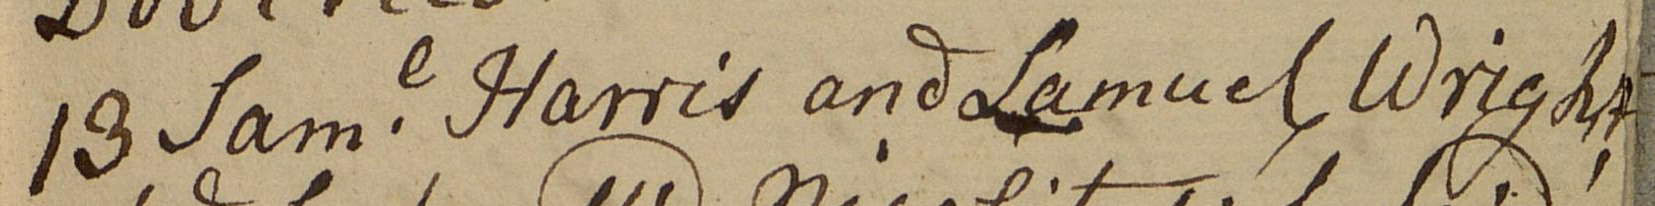13 Sam^l Harris and Lamuel Wright
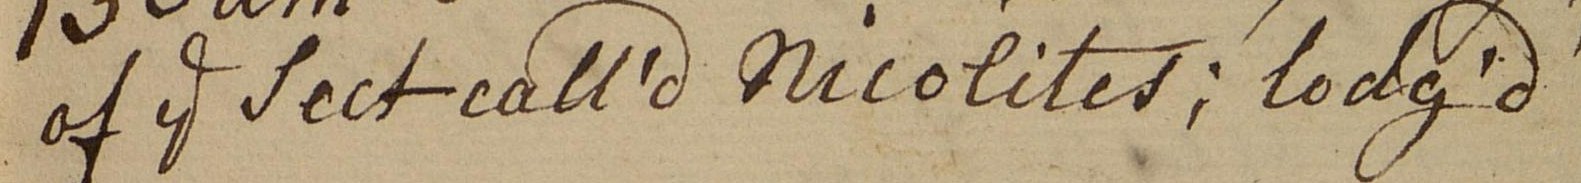of y^e Sect call'd Nicolites; lodg'd
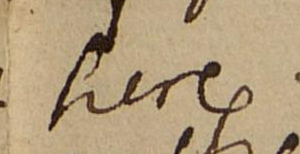here
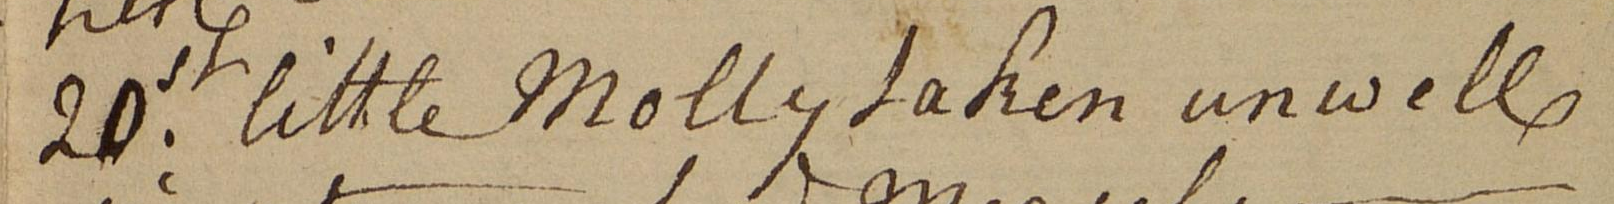20^st. little Molly taken unwell
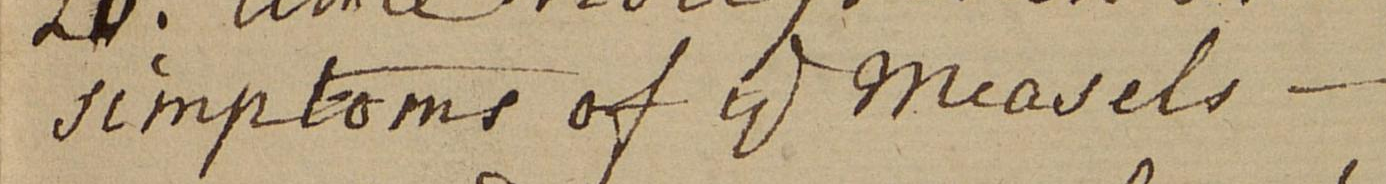simptoms of y^e Measels-
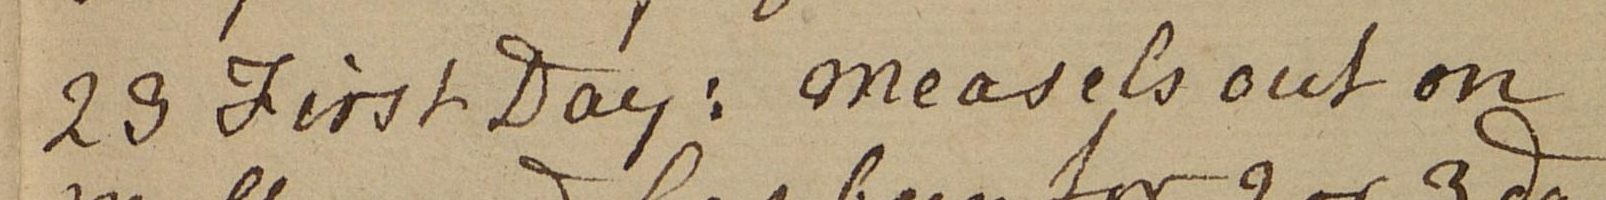23 First Day: measels out on
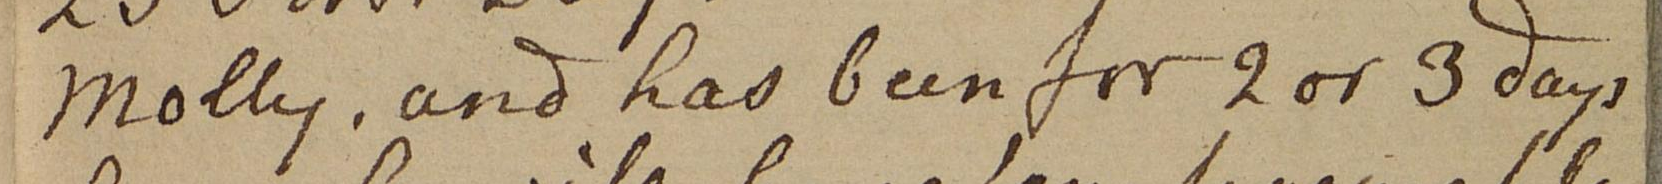Molly, and has been for 2 or 3 days
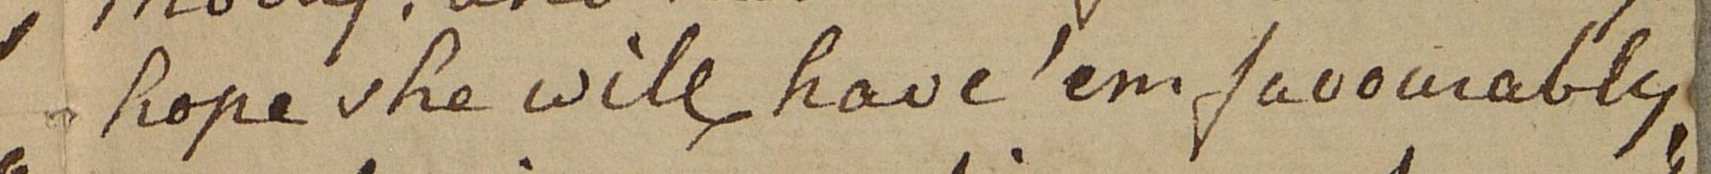hope she will have 'em favourably,
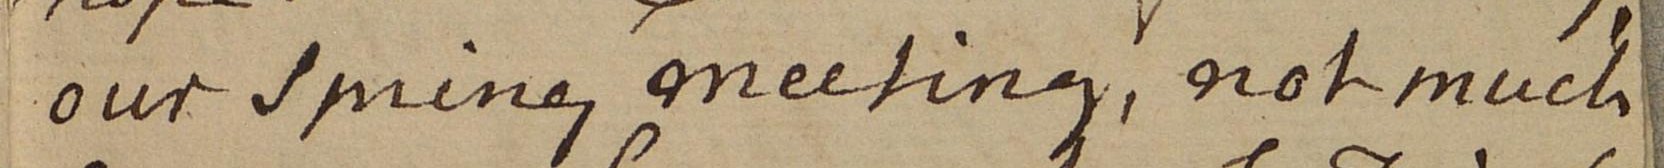our Spring meeting, not much
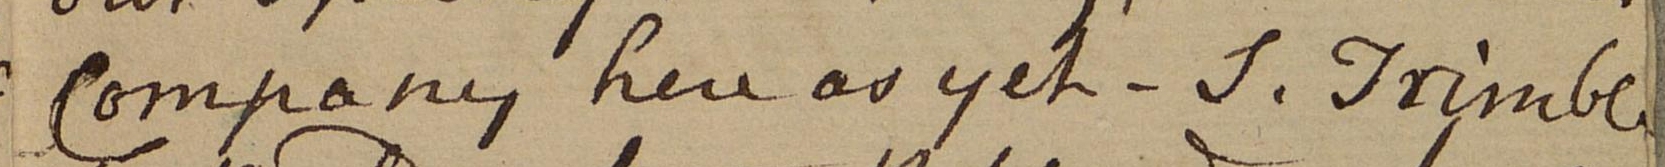Company here as yet- S. Trimble
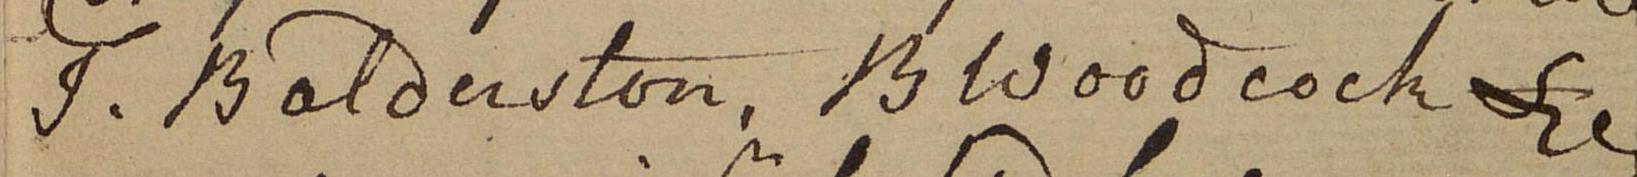J Balderston, B Woodcock &c
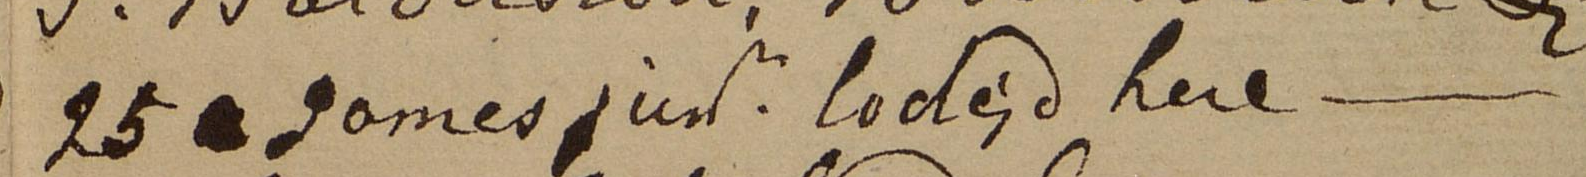25 A James jun^r. lodg'd here-
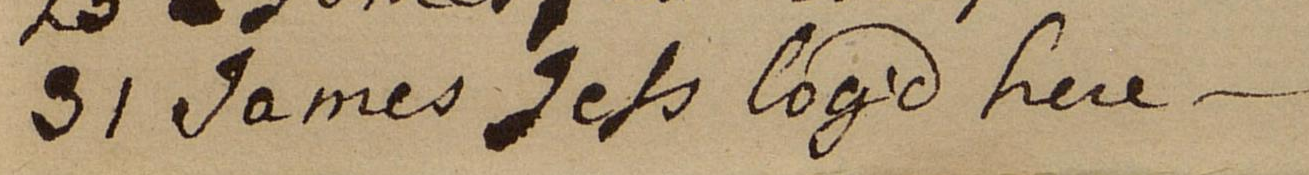31 James Jess log'd here-
